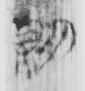則
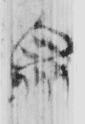眾
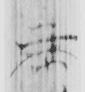不
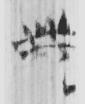戔
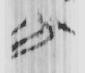分
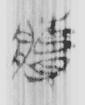{疒賣}
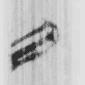勿
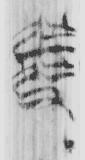{歮十廾}
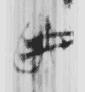母
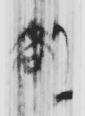咎
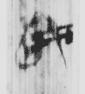母
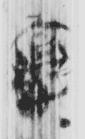{宀毳心}
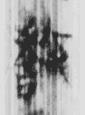{爻言攴}
